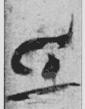氏（是）
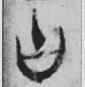古（故）
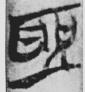聖
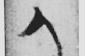人
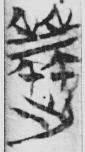兼
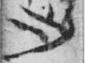此
